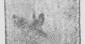五
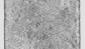十
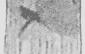五
